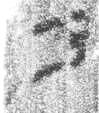乃
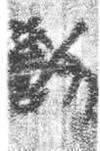○（教）
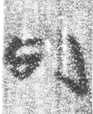含（今）
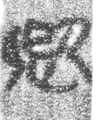卿
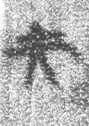大夫
